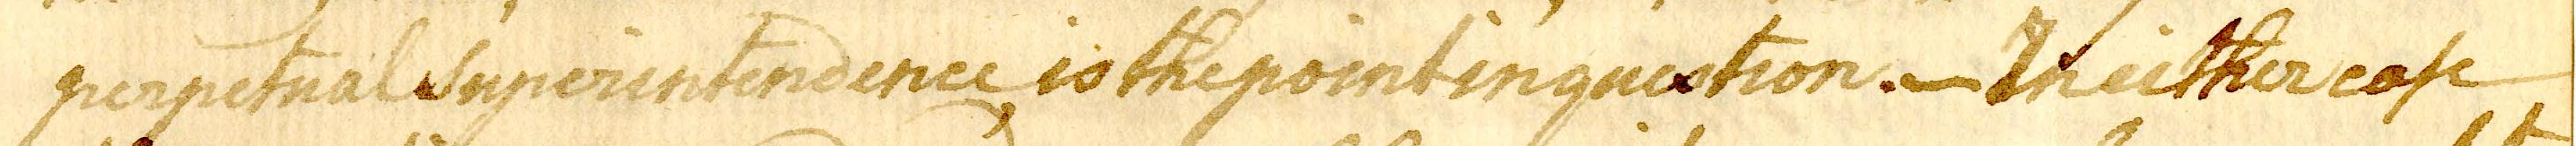perpetual superintendence is the point in question.- Tho either case
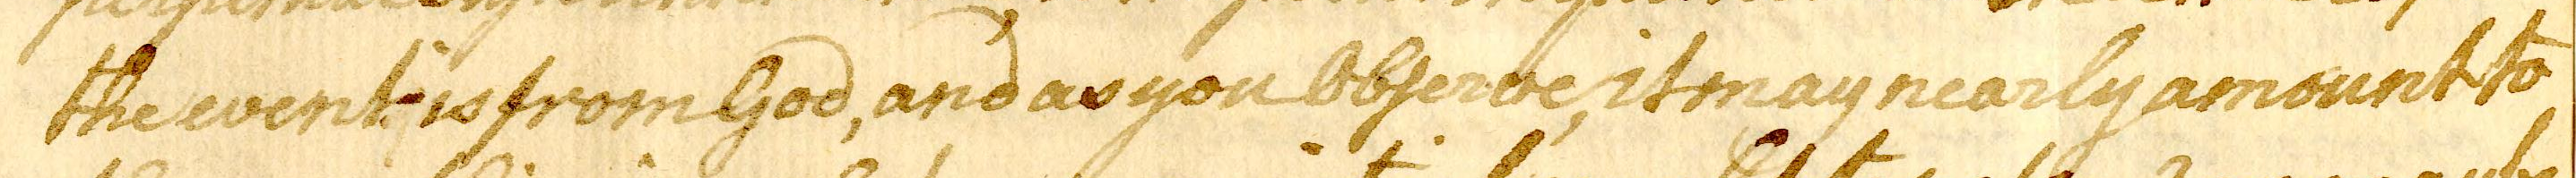the event. is from God, and as you Observe, it may nearly amount to
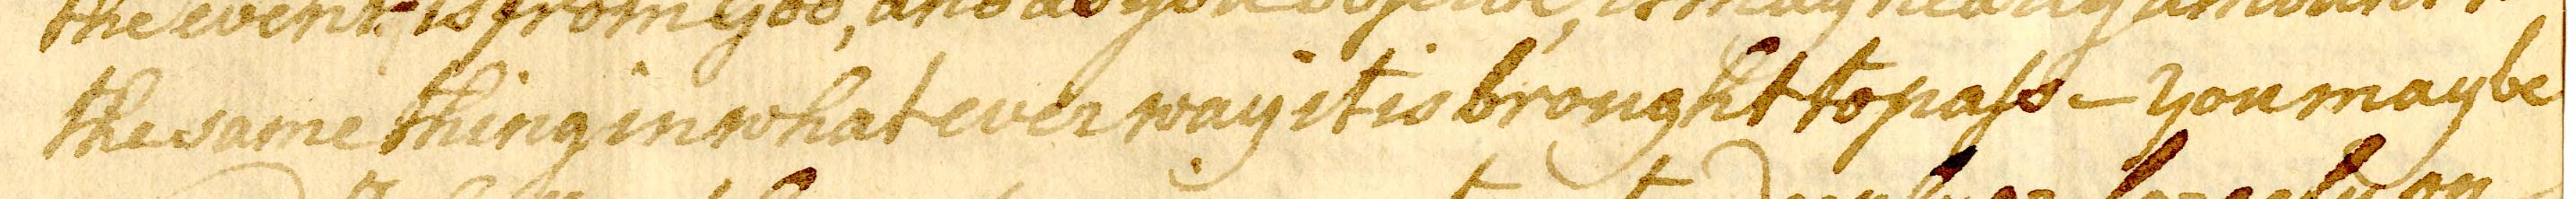the same thing in what ever way it is brought to pass-You may be
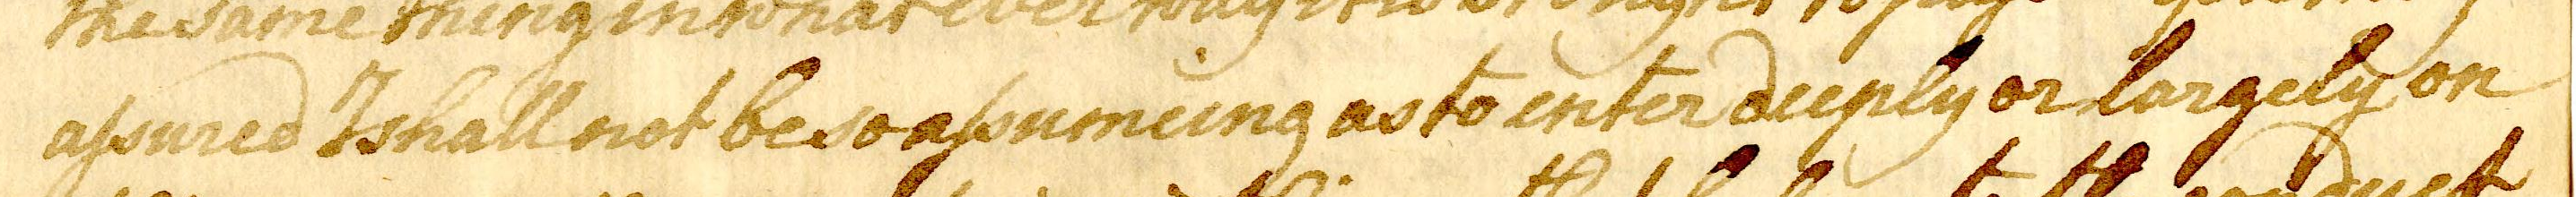assured I shall not be so assumeing as to enter deeply or largely on
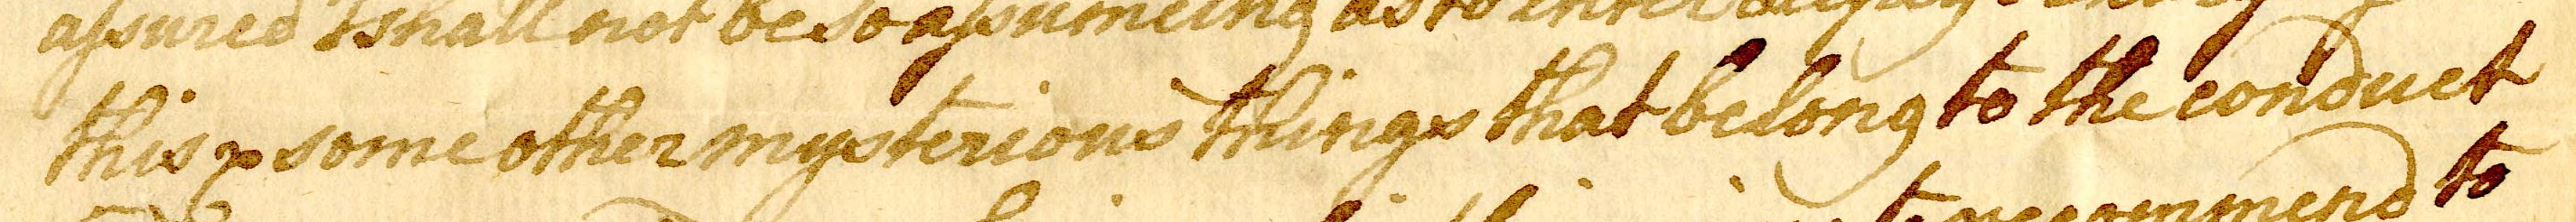this & some other mysterious things that belong to the conduct
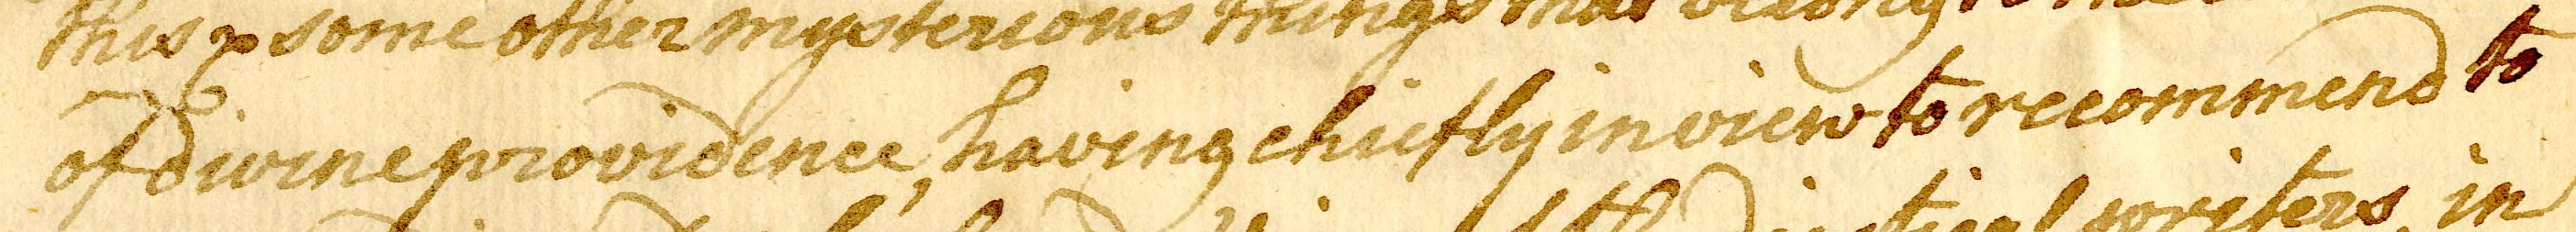of divine providence, having chiefly in view to recommend to
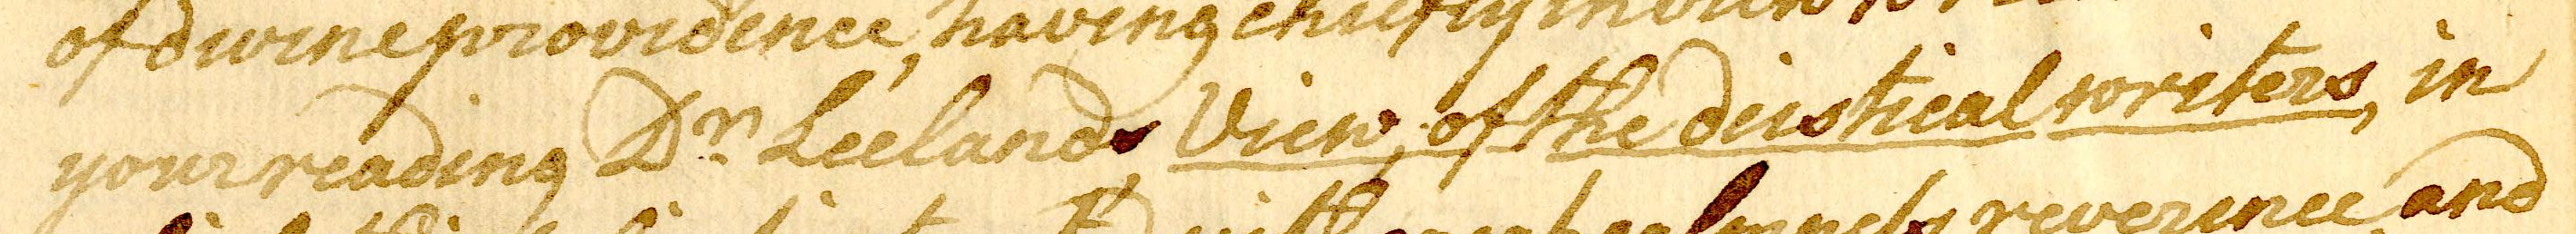your reading D^r. Leelands View, of the deistical writers, in
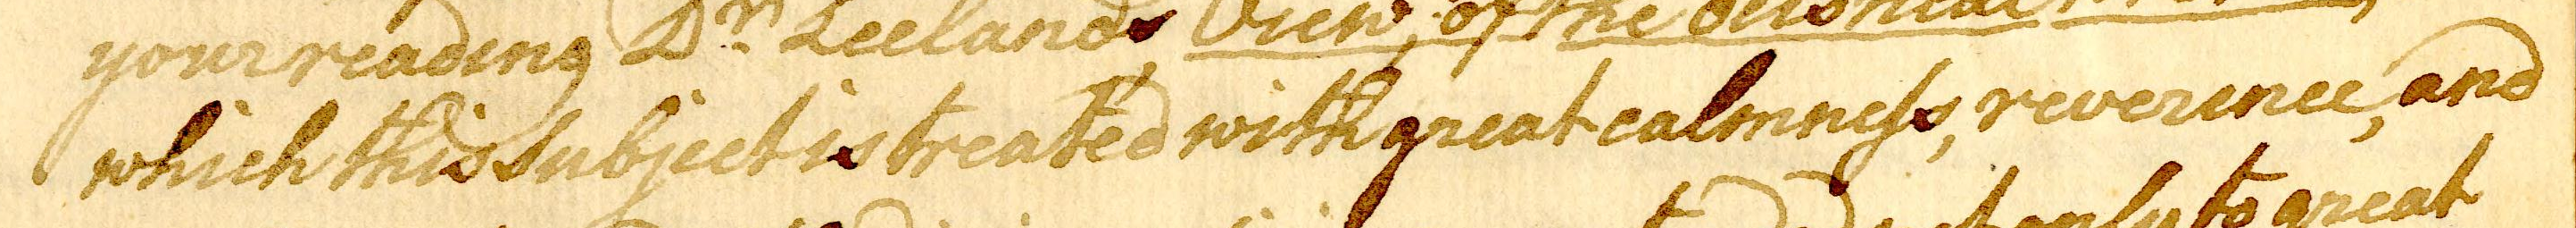which this Subject is treated with great calmness, reverence, and
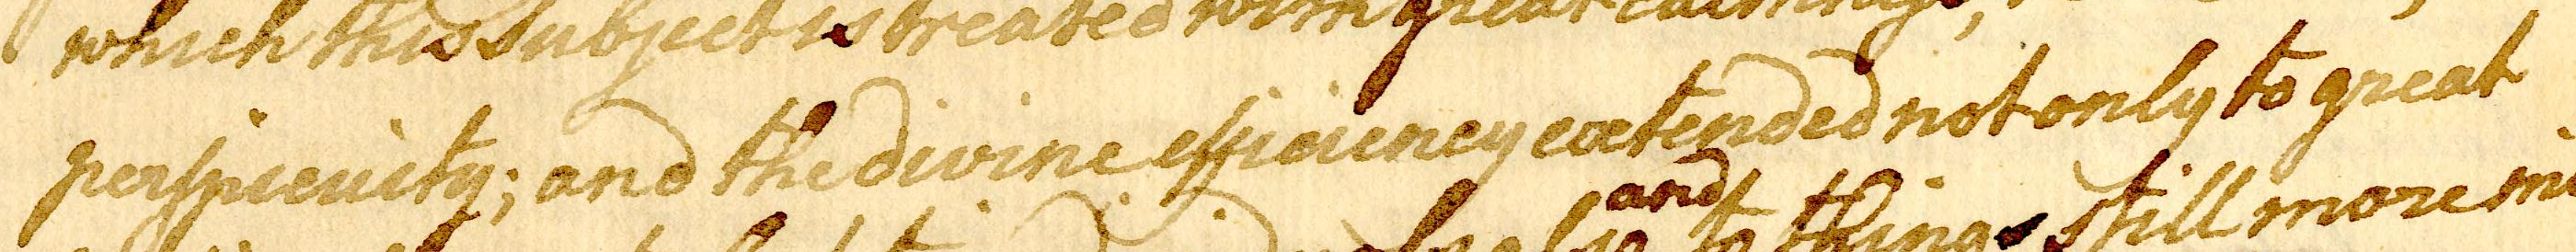perspicuity; and the divine efficiency extended not only to great
